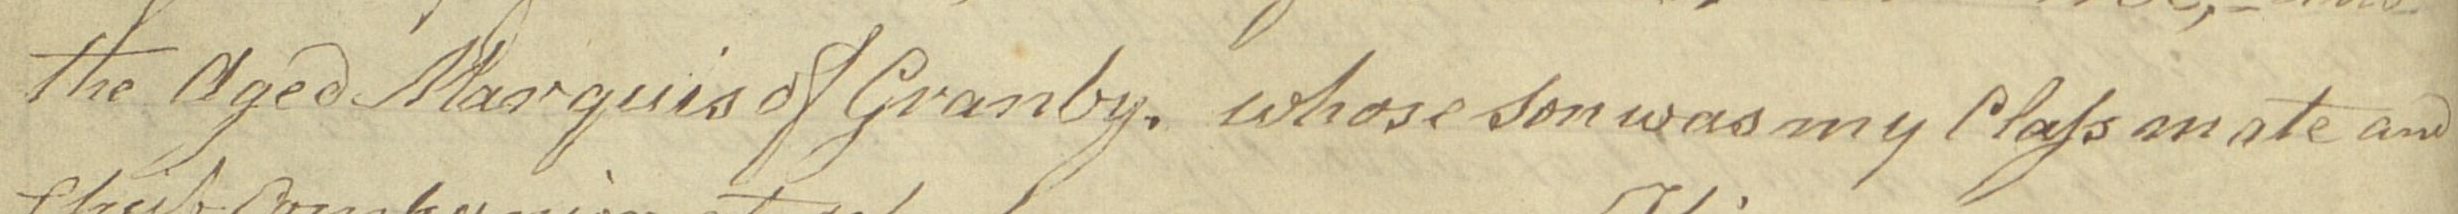the Aged Marquis of Granby, whose son was my Class mate and
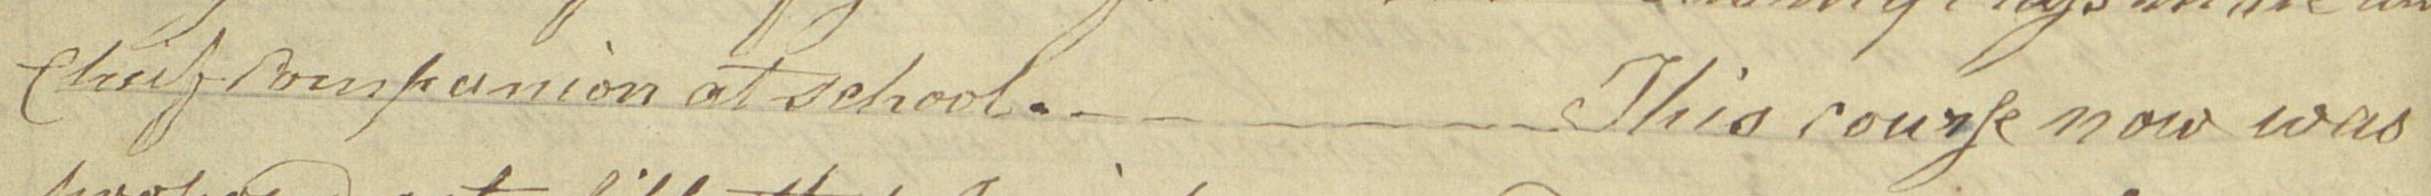Cheif companion at school. This course now was
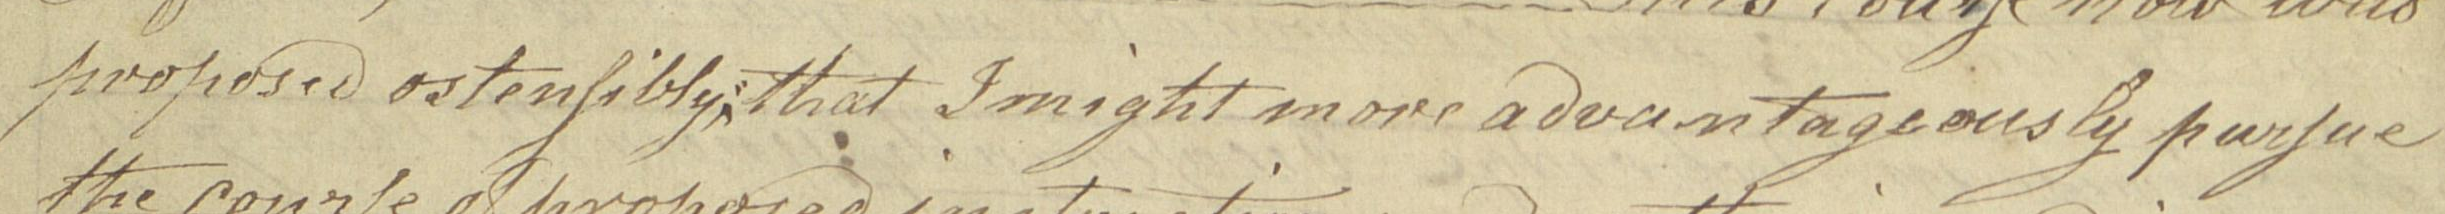proposed ostensibly, that I might more advantageously pursue
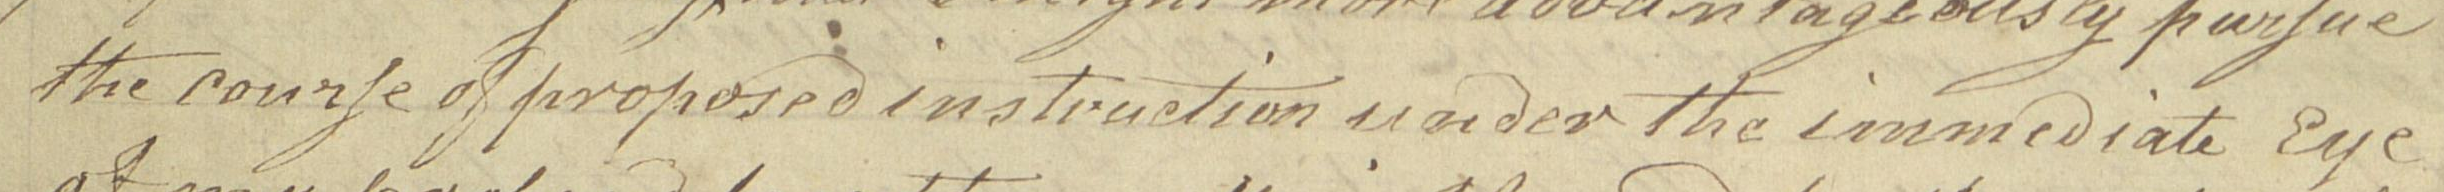the course of proposed instruction under the immediate Eye
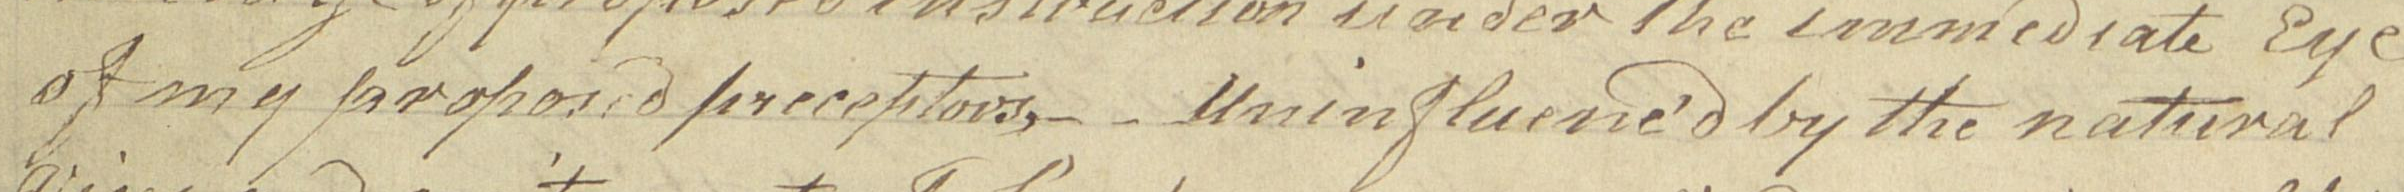of my proposed preceptors. Uninfluence'd by the natural
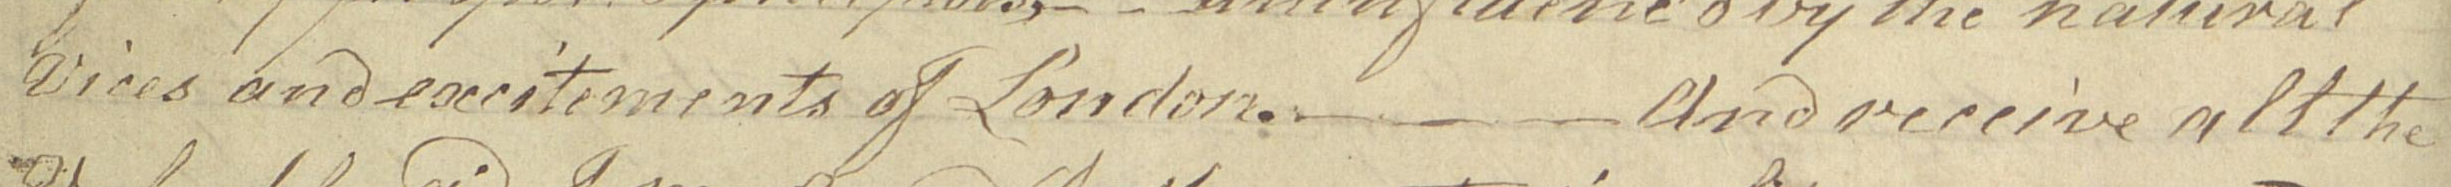Vices and excitements of London. And receive all the
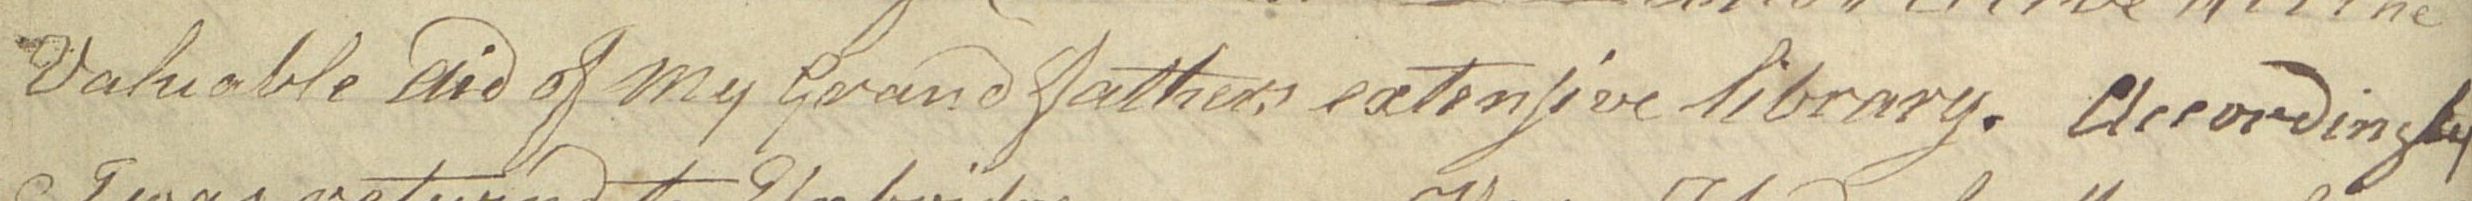Valuable and of My Grand fathers extensive library. Accordingly
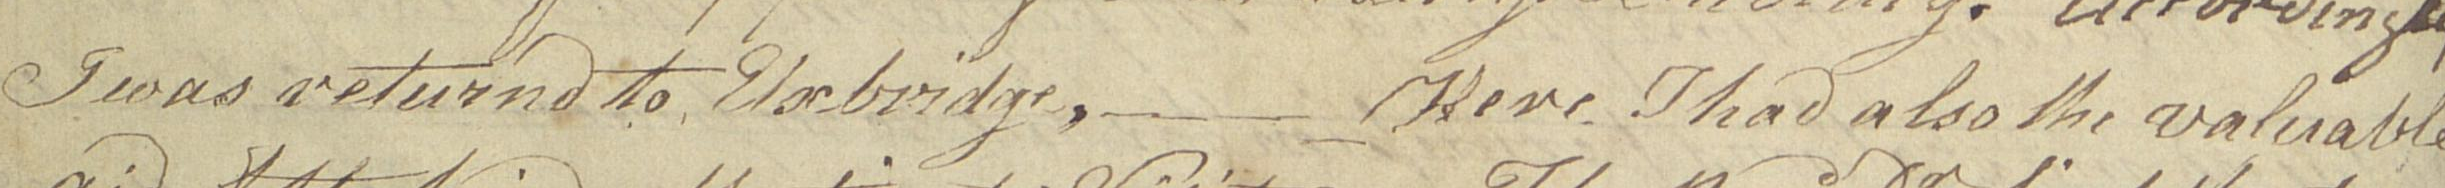I was returnd to Uxbridge, there I had also the valuable
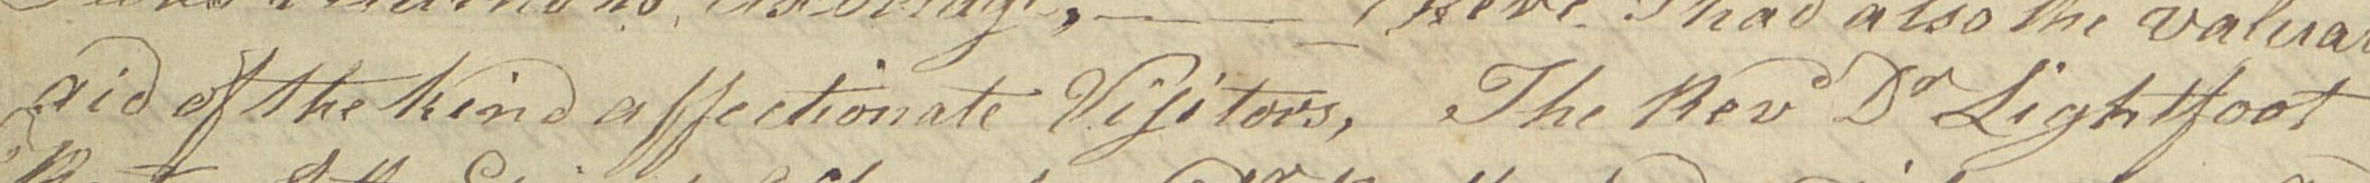aid of the kind affectionate Visitors, The Rev^ D^r Lightfoot
